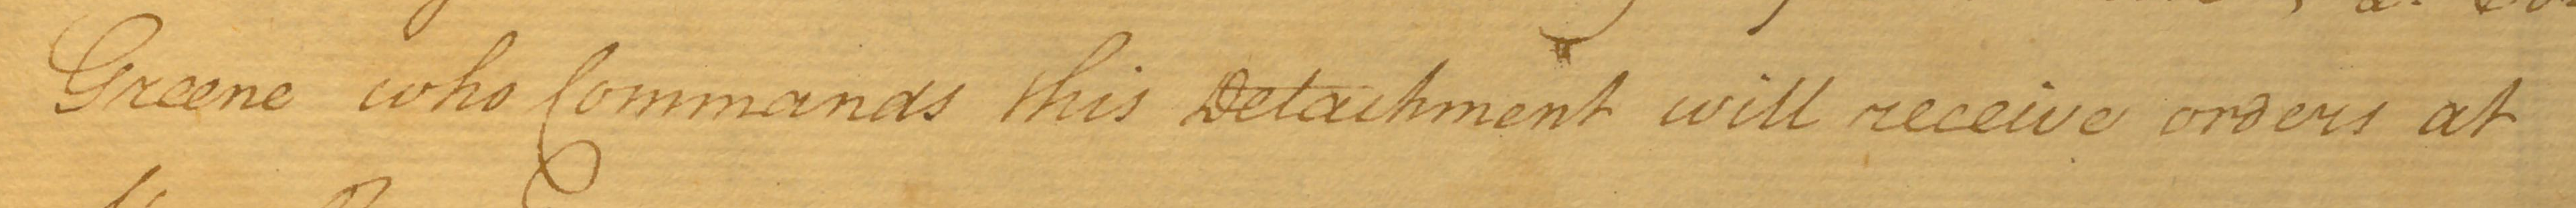Greene who Commands this Detachment will receive orders at
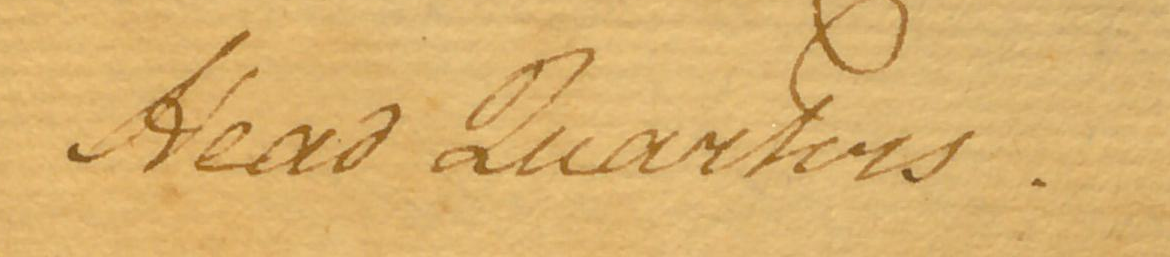Head Quarters.
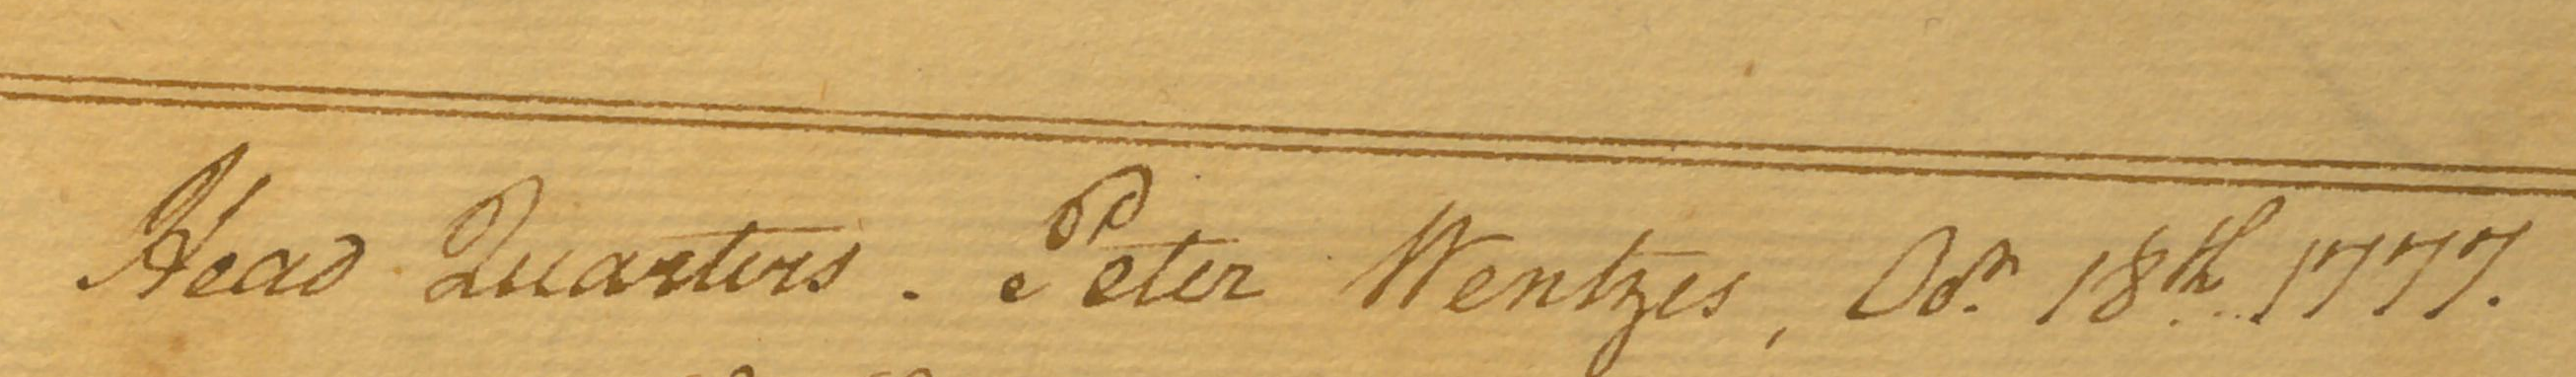Head Quarters. Peter Wentzes, Oc^r. 18^th 1777.
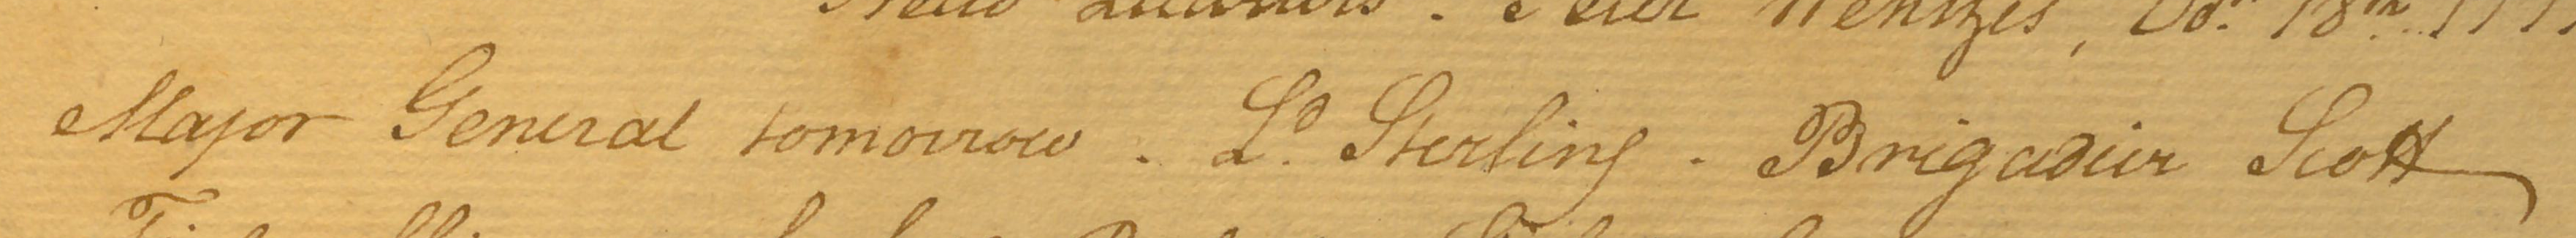Major General tomorrow. L^d. Sterling. Brigadier Scott
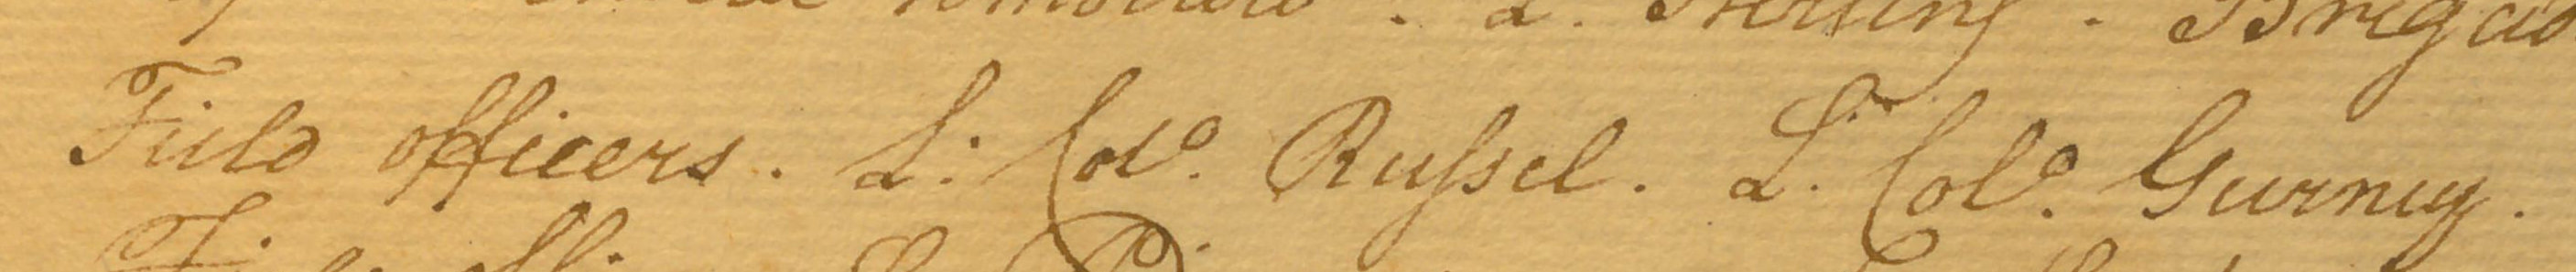Field officers. L: Col^o. Russel. L: Col^o. Gurney.
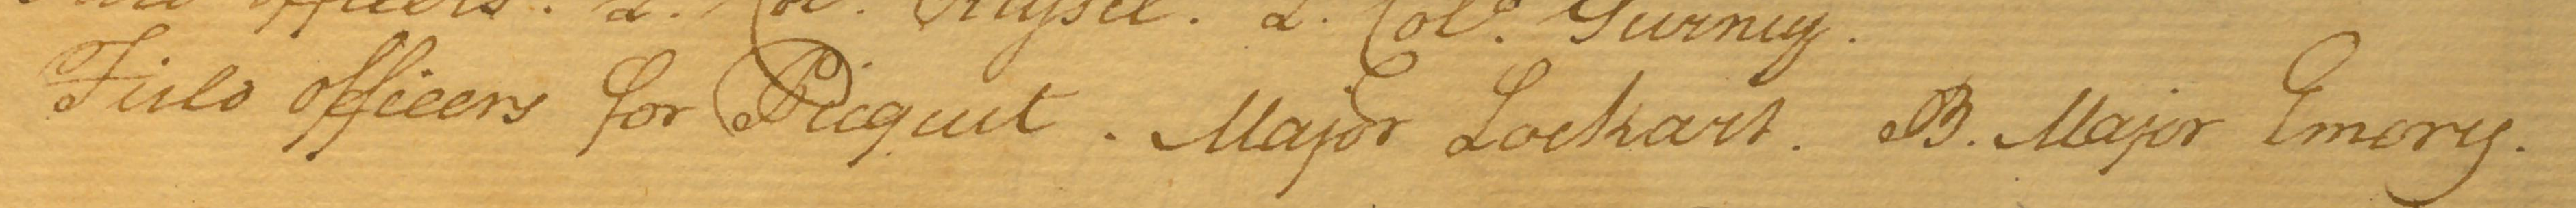Field officers for Picquet. Major Lockart. B. Major Emory.
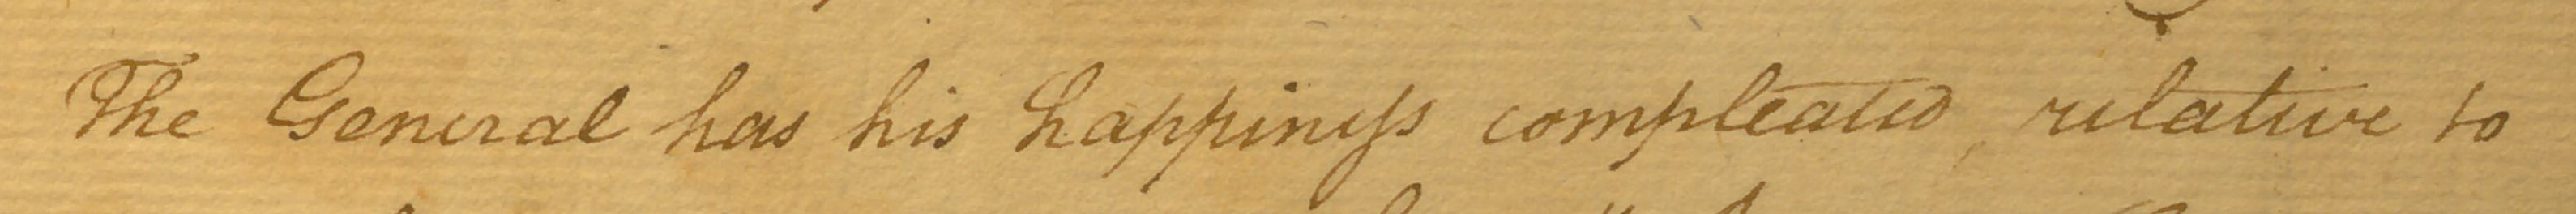The General has his happiness compleated relative to
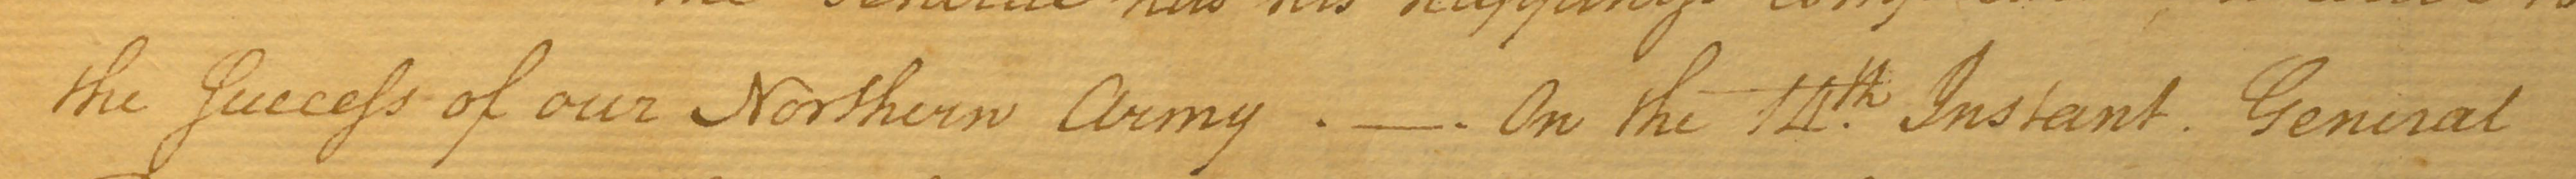the success of our Northern Army.-. On the 14^th. Instant. General
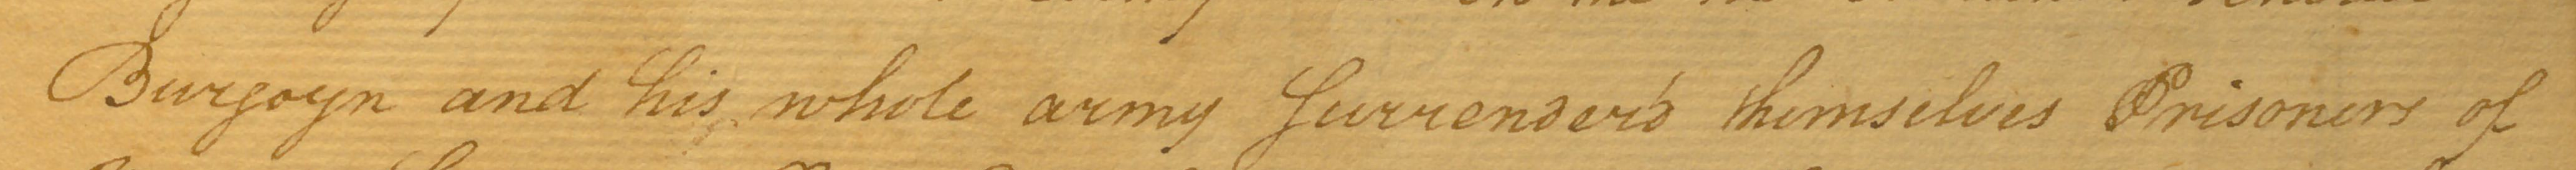Burgoyn and his whole army surrender'd themselves Prisoners of
